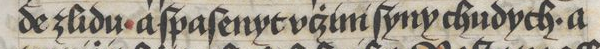de zlidu.a ſpaſenyt vcżini ſyny chudych.a
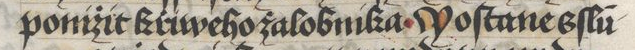poniżít kṙiweho żalobníka.Y oſtane sſlū
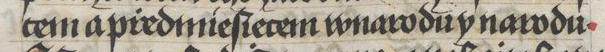cem a pṙedmíeſiecem wnarodu y narodu.
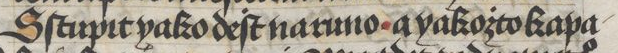Sſtupit yako deẛt naruno.a yakożto kapa¬
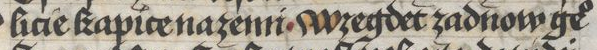licie kapice nazemi.Wzegdet zadnow geo
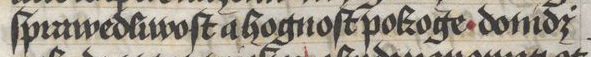ſprawedliwoſt a hognoſt pokoge.donidż
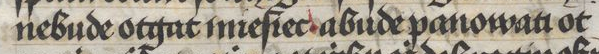nebude otgat mieſiec.a bude panowati ot
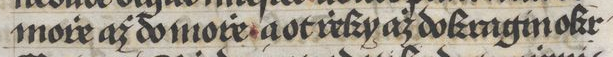moṙe aż do moṙe.a ot ṙeky aż dokragin okr¬
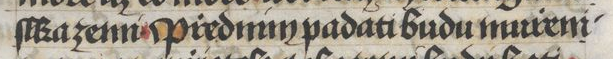ſlka zemi.Pṙedním padati budu muṙení¬
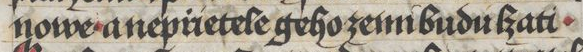nowe.a nepṙíetele geho zemi budu kati.
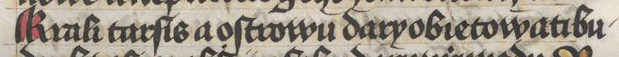Krali tarſis a oſtrowu dary obietowati bu¬
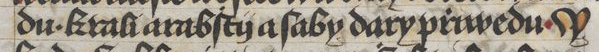du.krali arabẛtij a ſaby dary pṙiwedu.Y
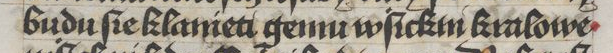budu ſie klanieti gemu wẛickni kralowe.
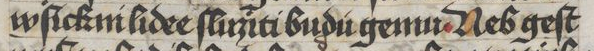wẛickni lidee ſlużiti budú gemu.Neb geſt
